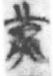黃
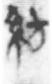紡
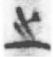之
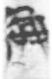綳
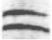二
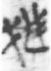○（戟）
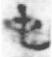屯
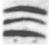三
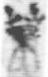菓（戈）
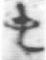屯
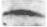一
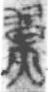翼
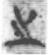之
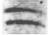二
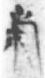旆
